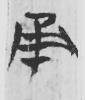甬
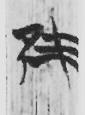隹
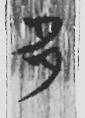多
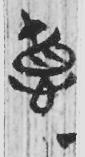惪
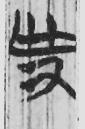拃（作）
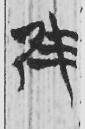隹
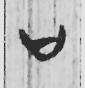口
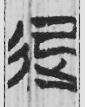起（起）
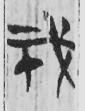戎
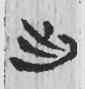出
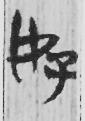好
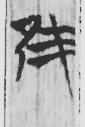隹
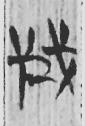{干戈}
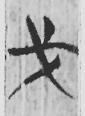戈
